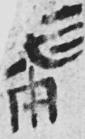○（幣）
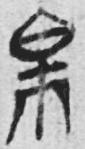帛
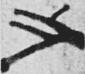之
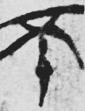不
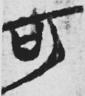可
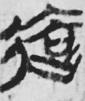迲（去）
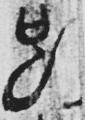也
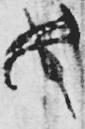民
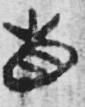眚（性）
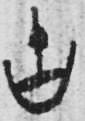古（固）
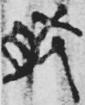肰（然）
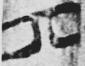亓（其）
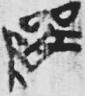○（隱）
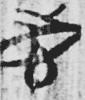志
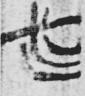必
